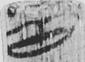田
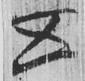五
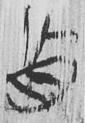貞
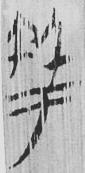竽
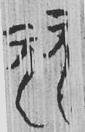瑟
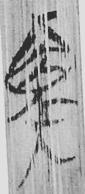衡
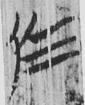於
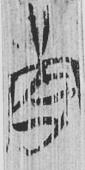前
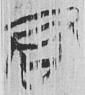君
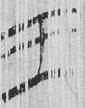王
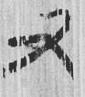又（有）
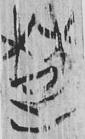楚
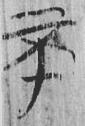不
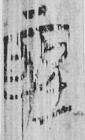聖（聽）
